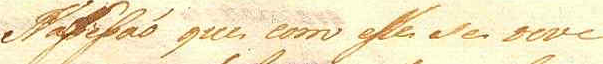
Na sessaõ que com elle se teve
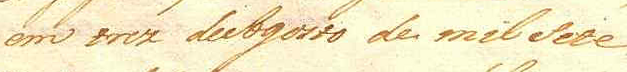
em trez de Agosto de mil sete
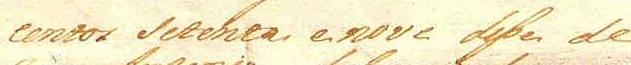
centos setenta e nove disse de
